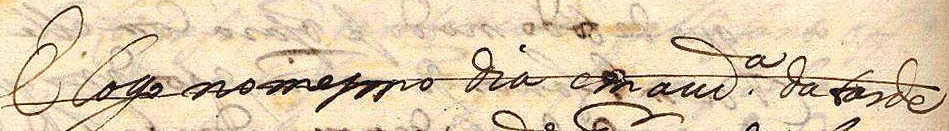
E logo no mesmo dia em aud.a da tarde
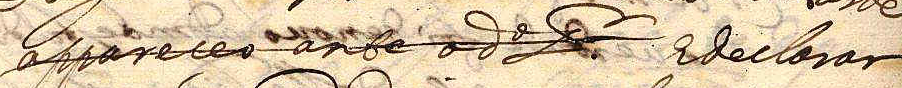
appareceo ante o do s.r E declarar
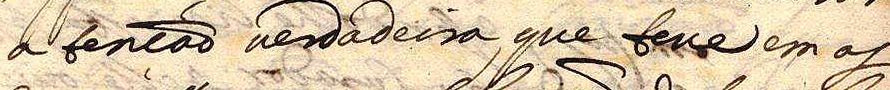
a tenção uerdadeira que teue em as
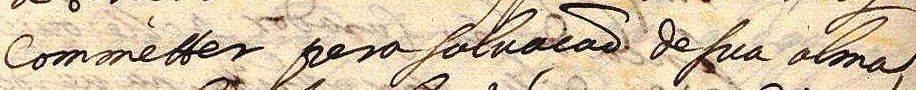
commetter pera saluaçaõ de sua alma
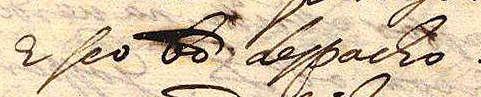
E seo bō despacho?
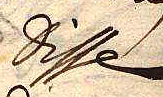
Disse
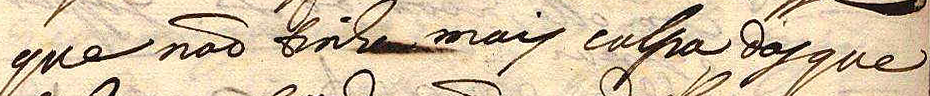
que não tinha mais culpa das que
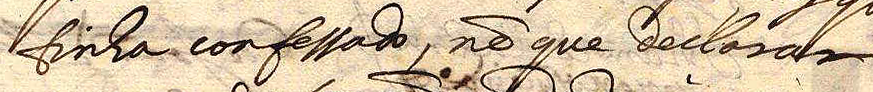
tinha confessado, nē que declarar
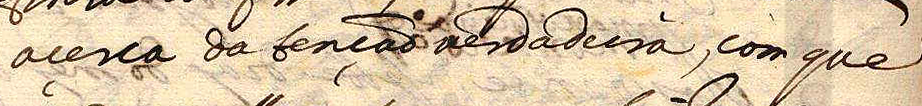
acerca da tenção verdadeira, com que
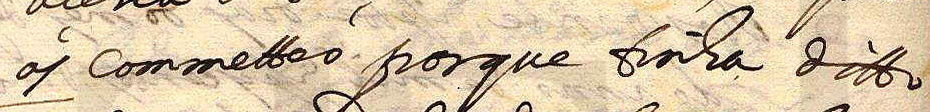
as commetteo, porque tinha ditto
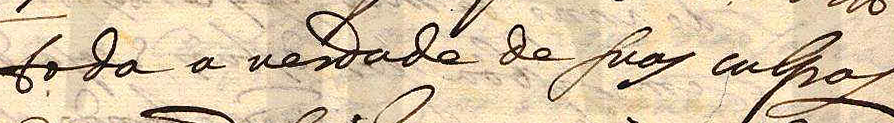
toda a uerdade de suas culpas
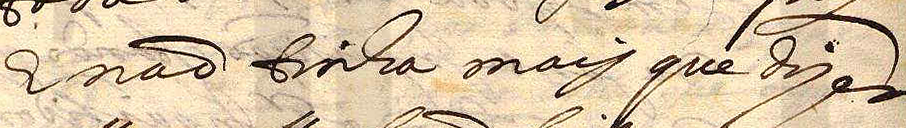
E naõ tinha mais que dizer
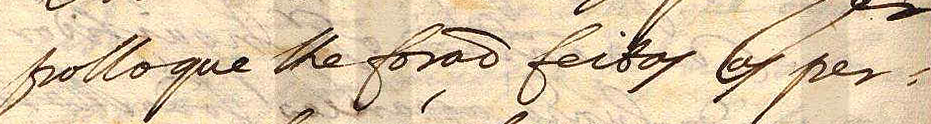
pollo que lhe forão feitas as per
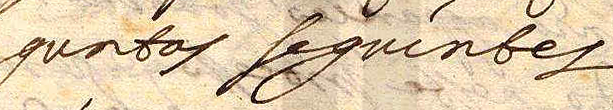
guntas seguintes
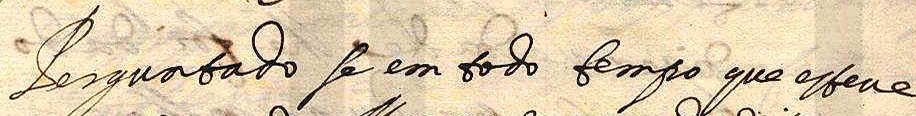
Perguntado se em todo tempo que esteue
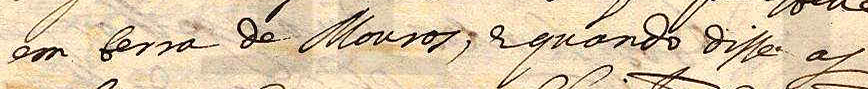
em terra de Mouros, E quando disse as
